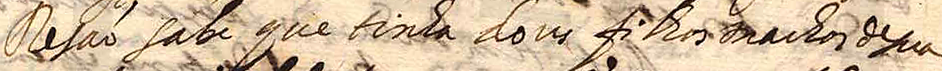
Resaõ sabe que tinha dous filhos machos de sua
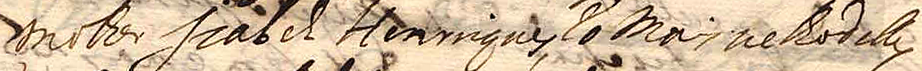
molher Jzabel Henrriques, & o Mais uelho delles
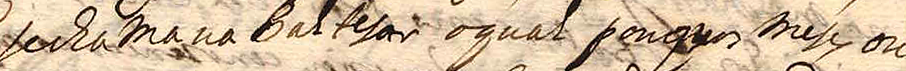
se chamaua Baltesar o qual pouquos meses ou
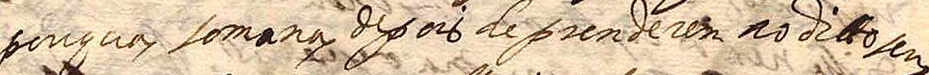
pouquas somanas depois de prenderem ao ditto seu
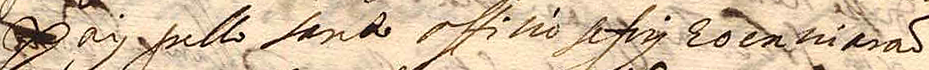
pay pello santo officio se foy E o enuiaraõ
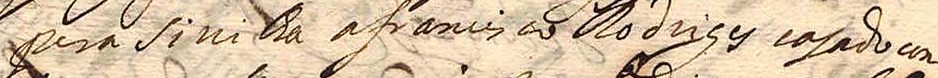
pera Siuilha a francisco Rodriges casado con
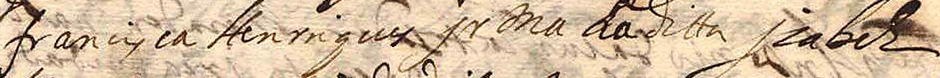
francisca Henrriques jrma da ditta JzabeL
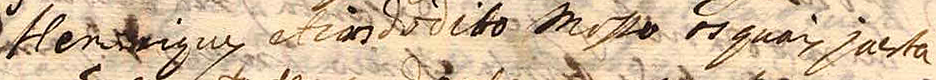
Hen_riques e tias do ditto mosso os quais ja esta
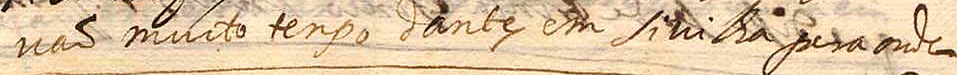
uaõ muito tenpo dantes em Siuilha pera onde
